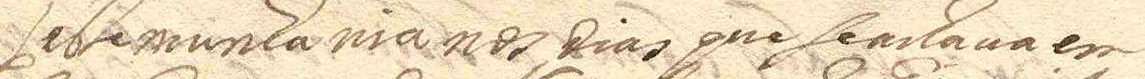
Testemunha uia nos dias que se achaua em
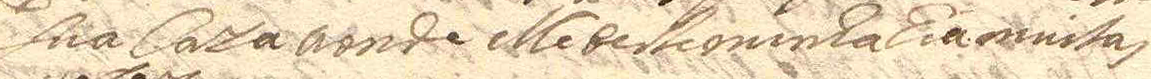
sua Caza aonde elle testemunha hia muitas
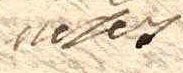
uezes
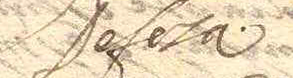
Defeza
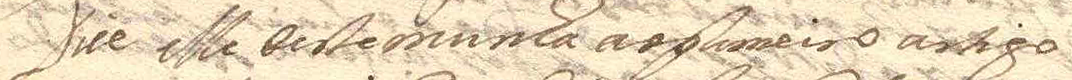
Dice elle testemunha ao primeiro artigo
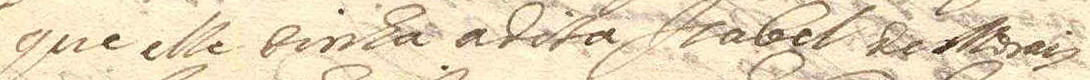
que elle tinha a dita Jzabel de Morais
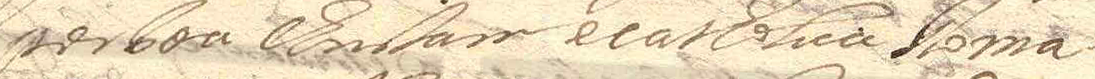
por boa christam e catholica Roma
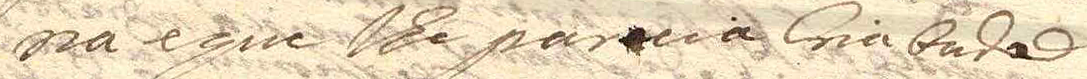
na e que lhe parecia Cria tudo
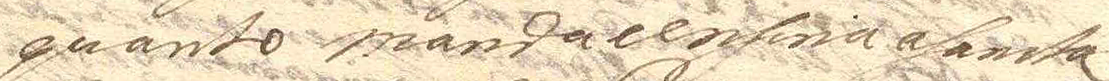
quanto manda e ensina a santa
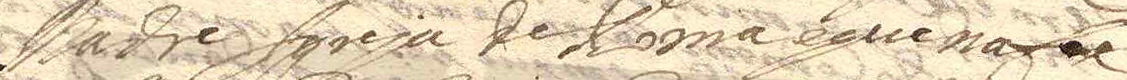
Madre Jgreja de Roma que na fee
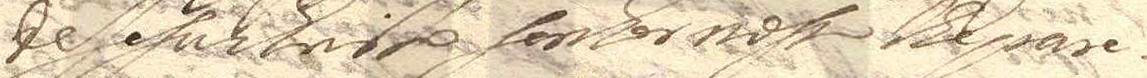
de Jesu christo senhor nosso lhe pare
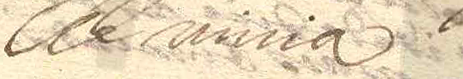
ce uiuia
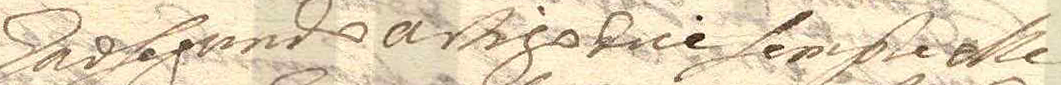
E ao segundo artigo dice sempre elle
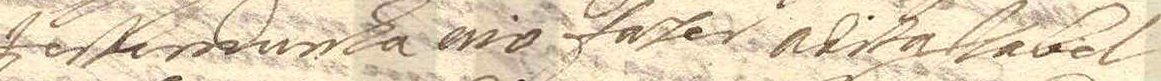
testemunha uio fazer a dita Jzabel
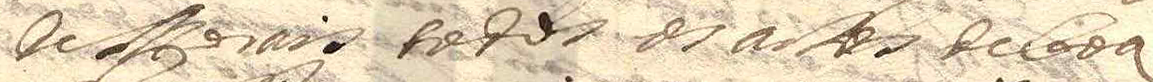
de Morais todos os actos de boa
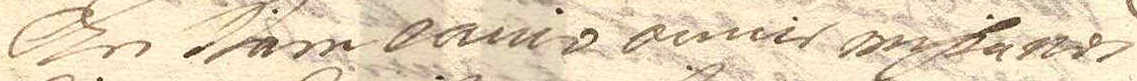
Christam e a uio ouuir missa nos
